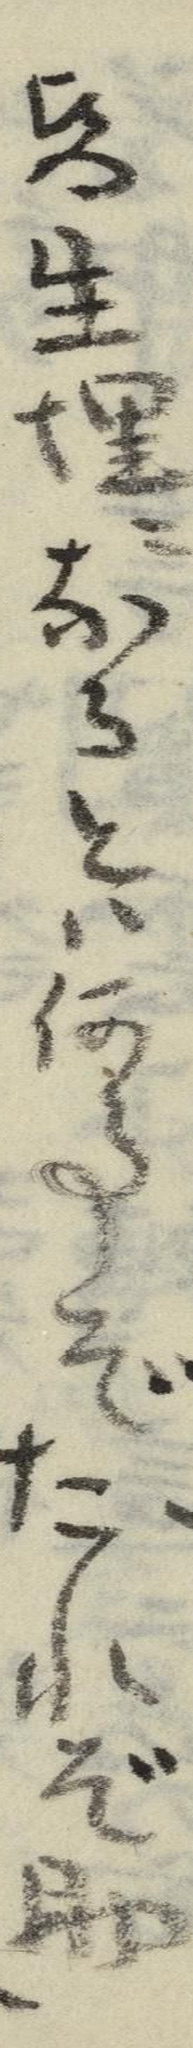皆生埋二なるとハ何事ぞたれぞ助て
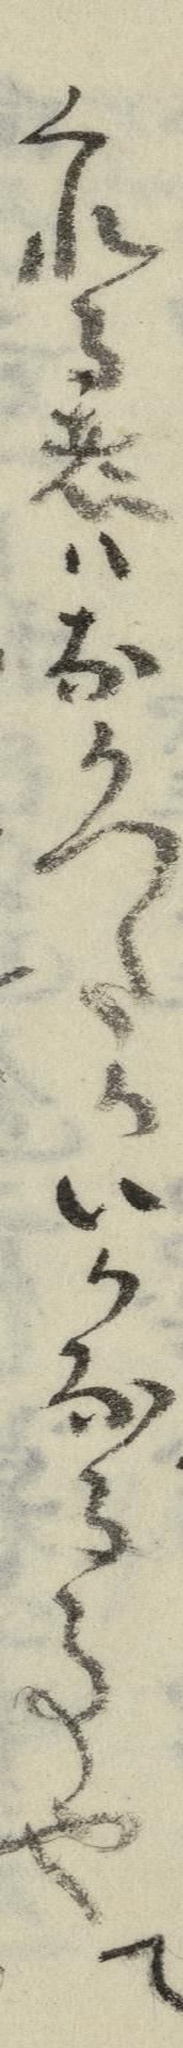くれる者ハなかつたかいかなる事や
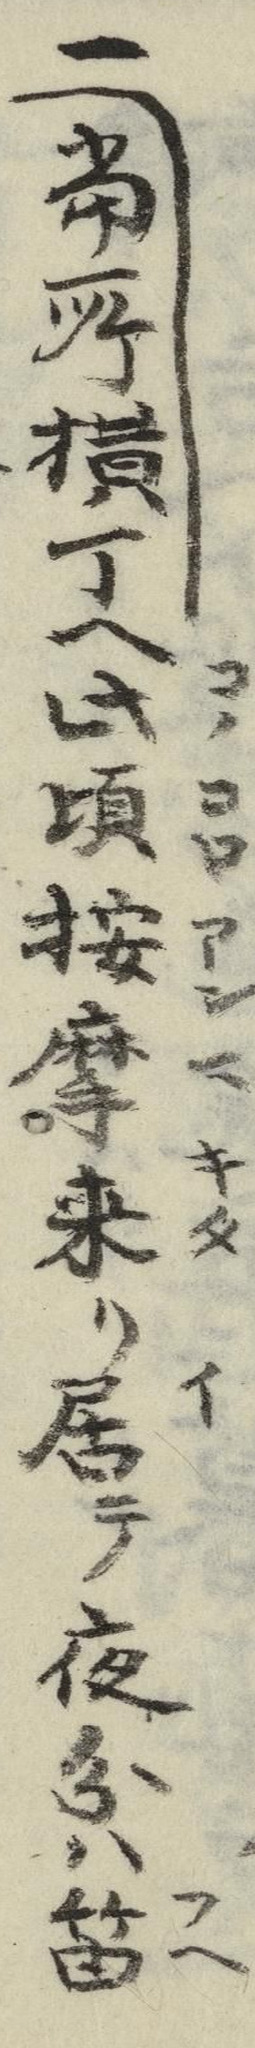一当所横丁へ此頃按摩来り居テ夜分ハ笛
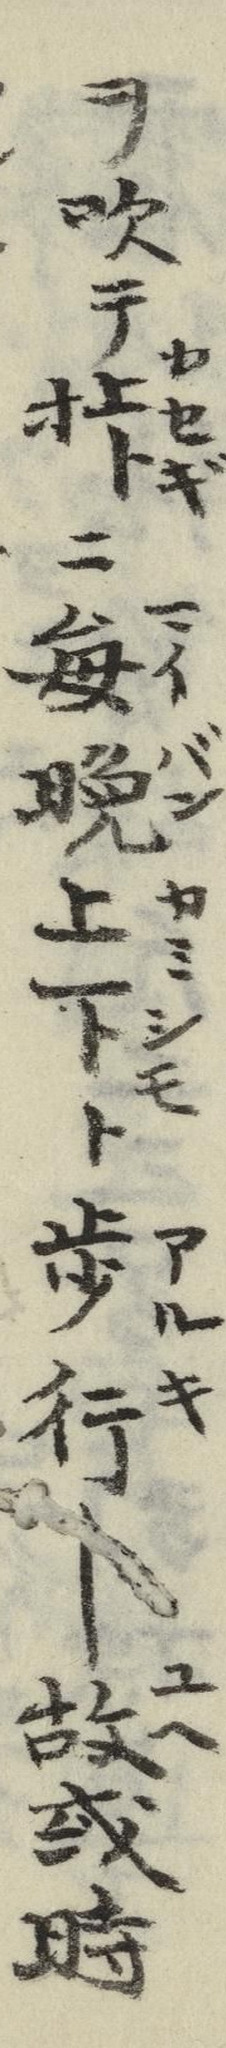ヲ吹テ挊二毎晩上下ト歩行し故或時
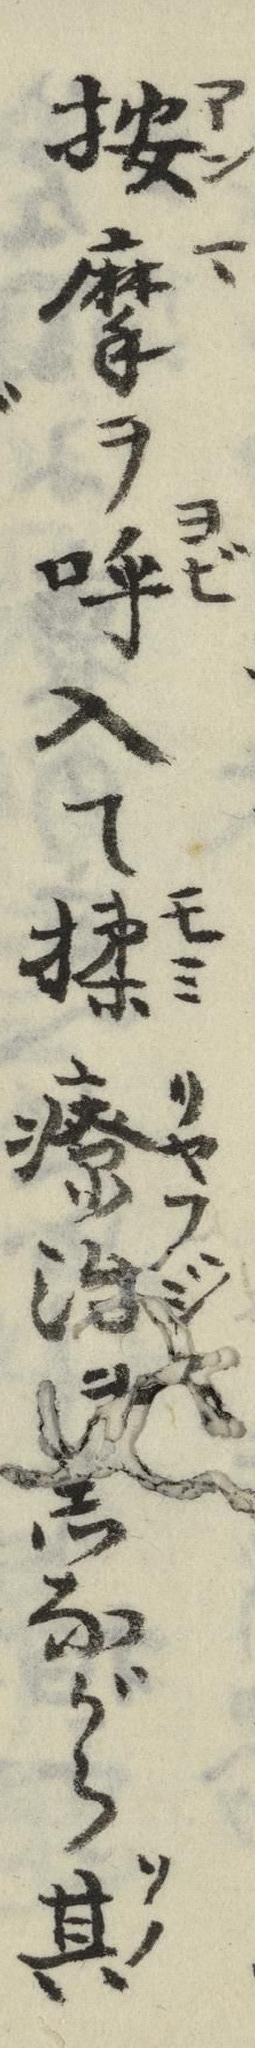按摩ヲ呼入て揉療治をしながら其
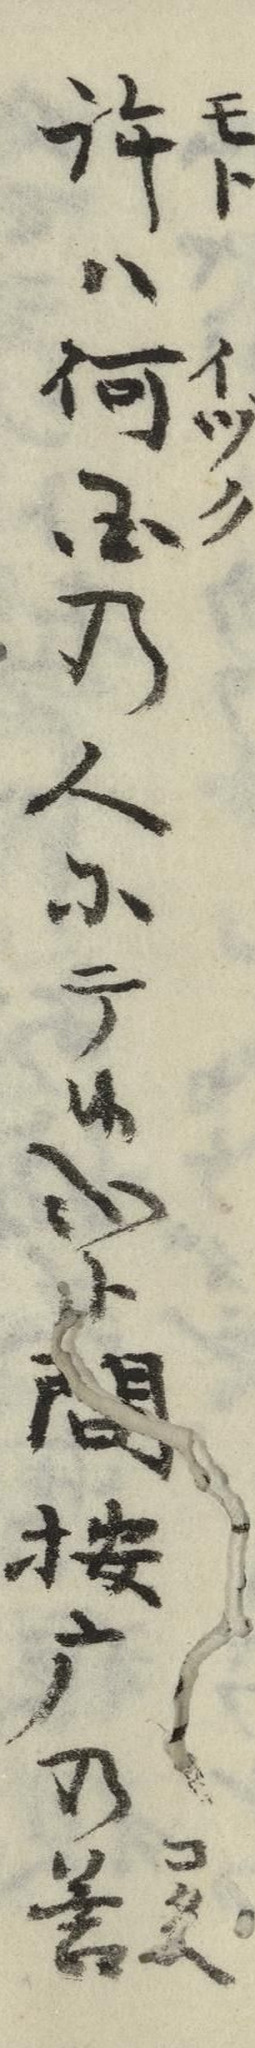許ハ何国乃人にテ候哉ト問按广乃答
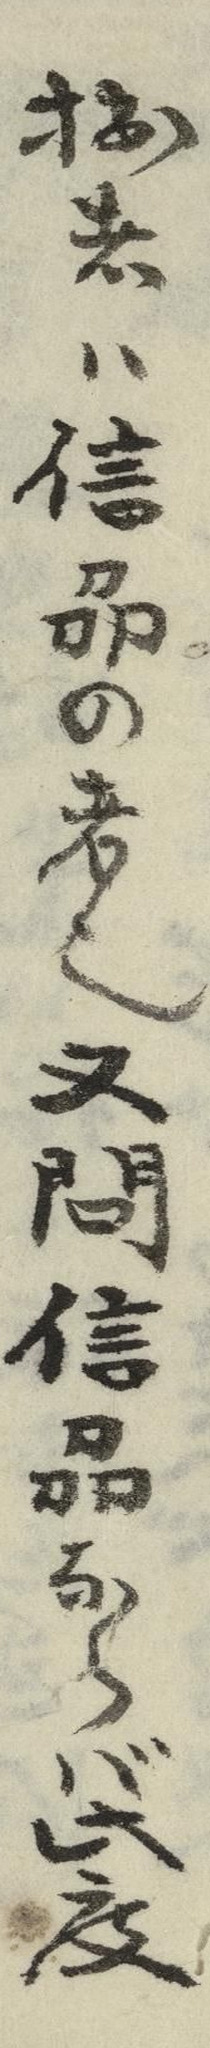拙者ハ信州の者也又問信州ならバ此度
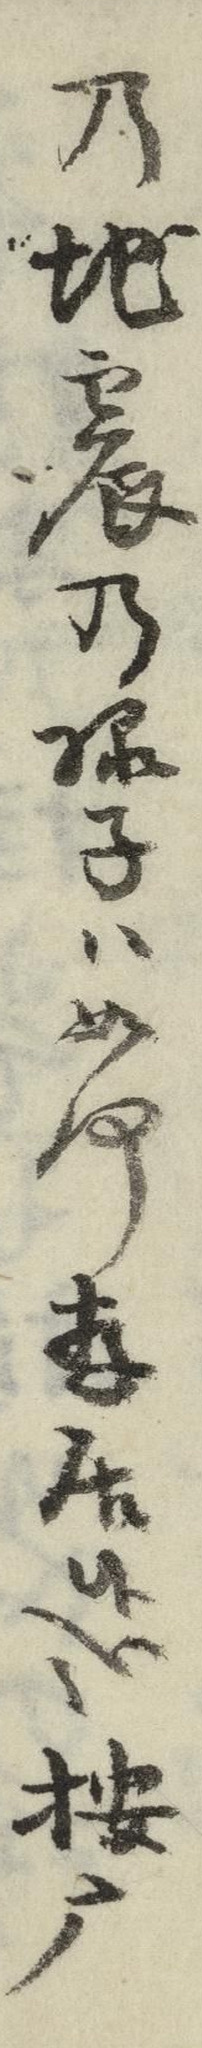乃地震乃様子ハ如何存居候哉按广
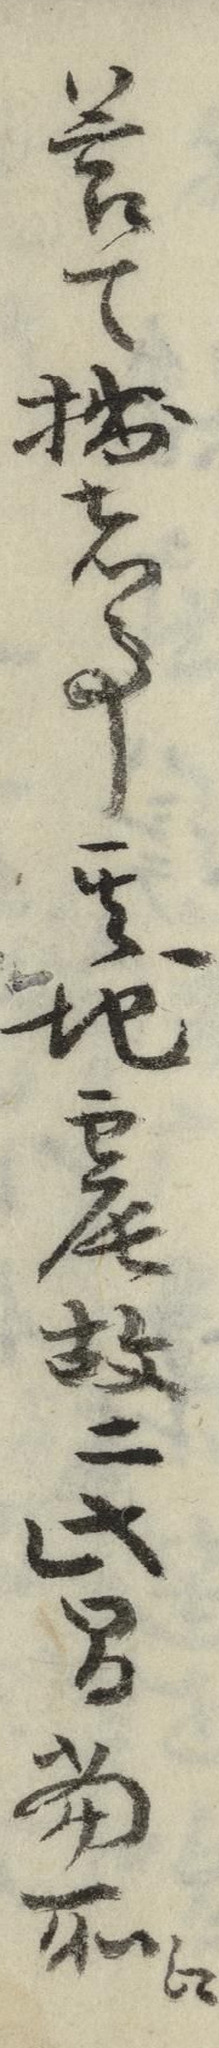答て拙者事其地震故二此間当所江
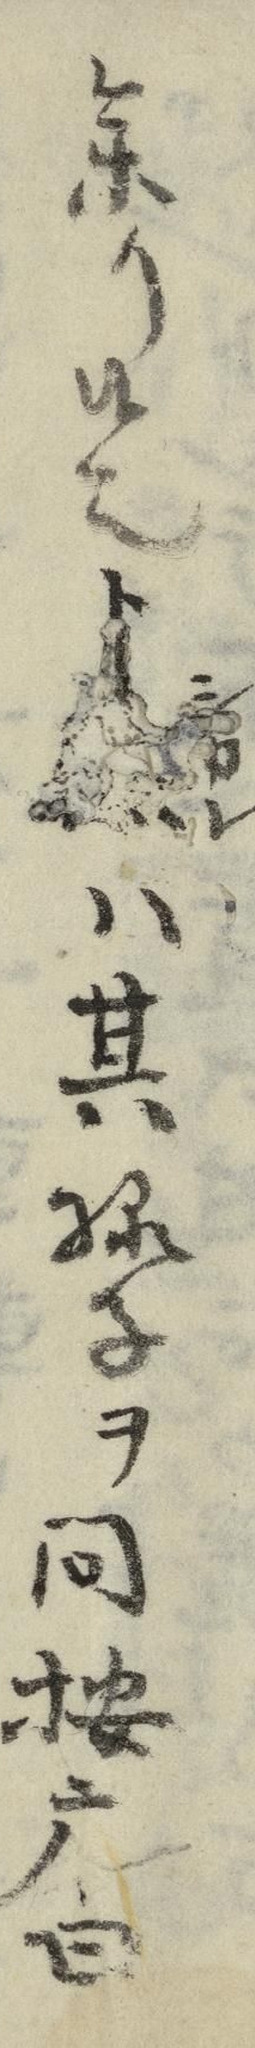参り候也ト然ハ其様子ヲ問按广曰
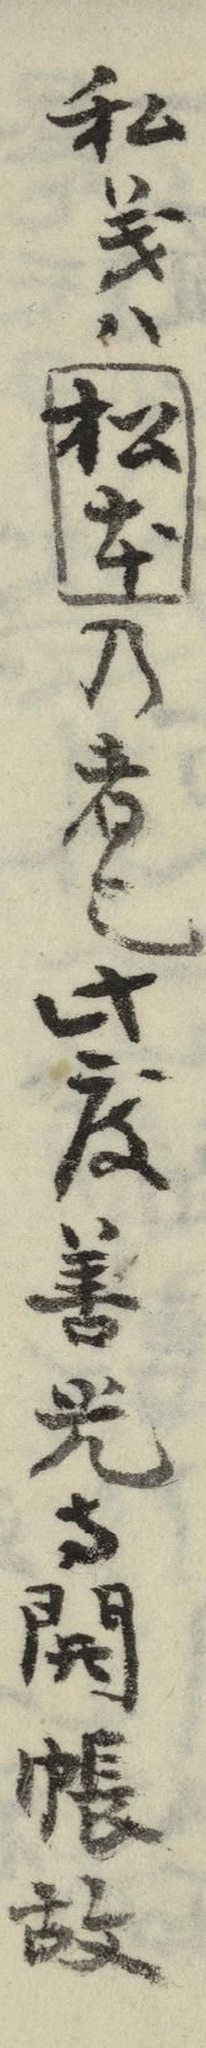私義ハ松本乃者也此度善光寺開帳故
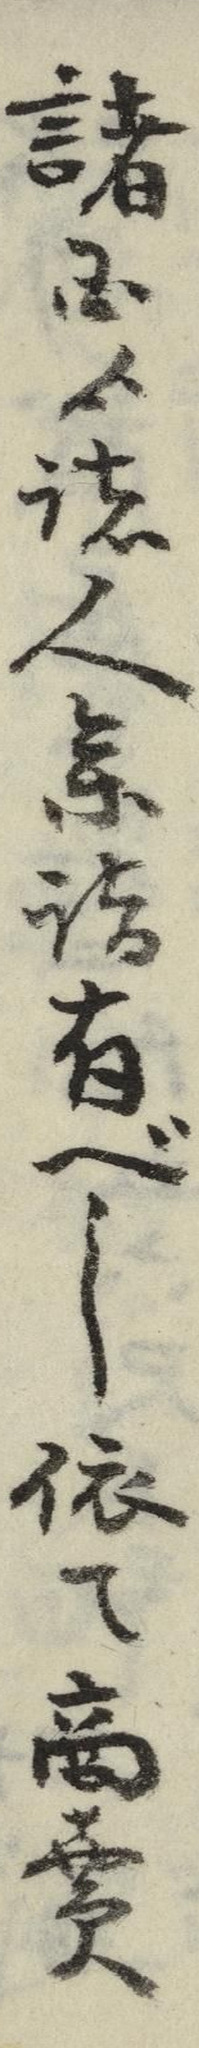諸国ゟ諸人参詣有べし依て商売
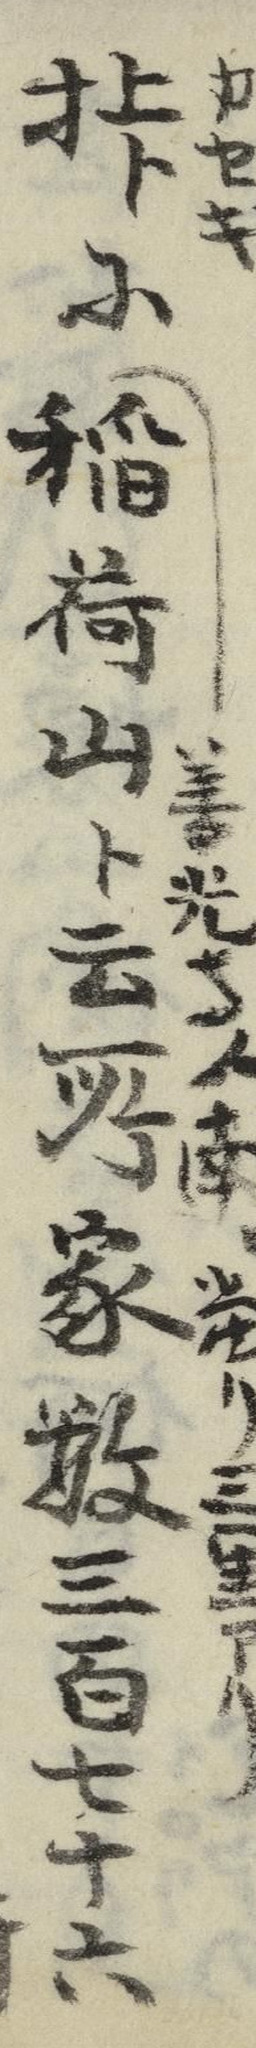挊に稲荷山ト云所家数三百七十六軒
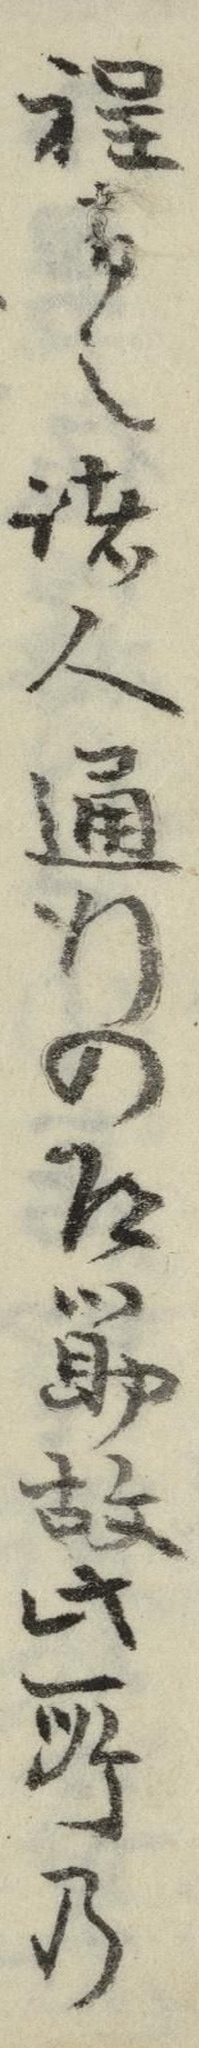程有之諸人通行の道筋故此所乃
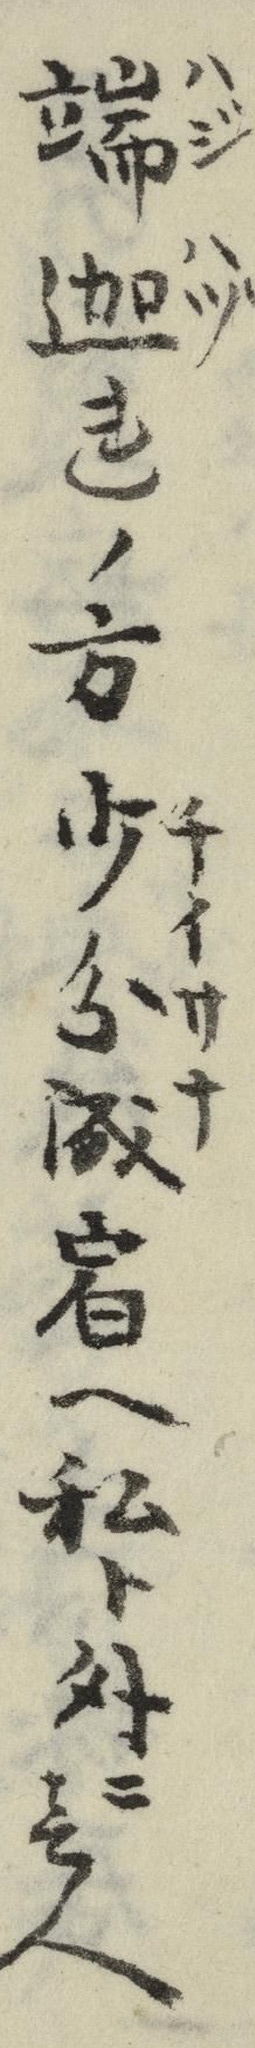端迦れノ方少分成宿へ私ト外二壱人
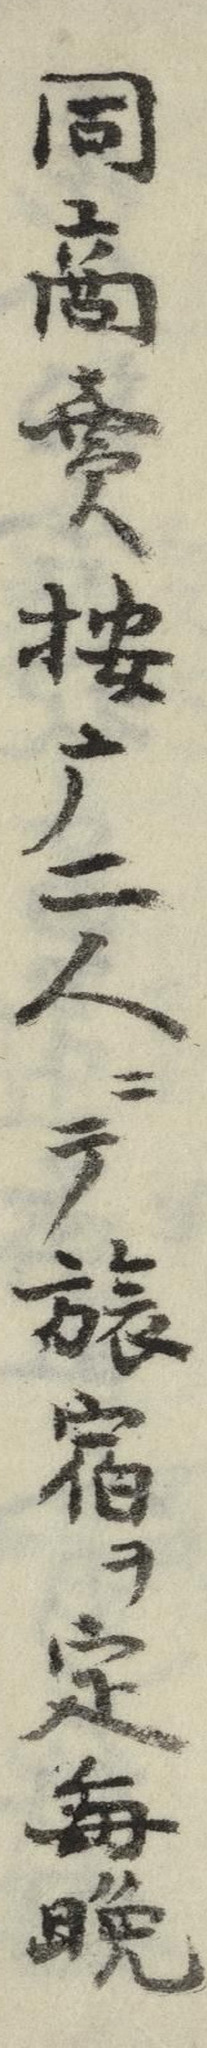同商売按广二人ニテ旅宿ヲ定毎晩
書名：信州大地震一件之冩　丁未弘化四年三月吉日
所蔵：東京大学地震研究所図書室 Earthquake Research Institute Library, The University of Tokyo, JAPAN
